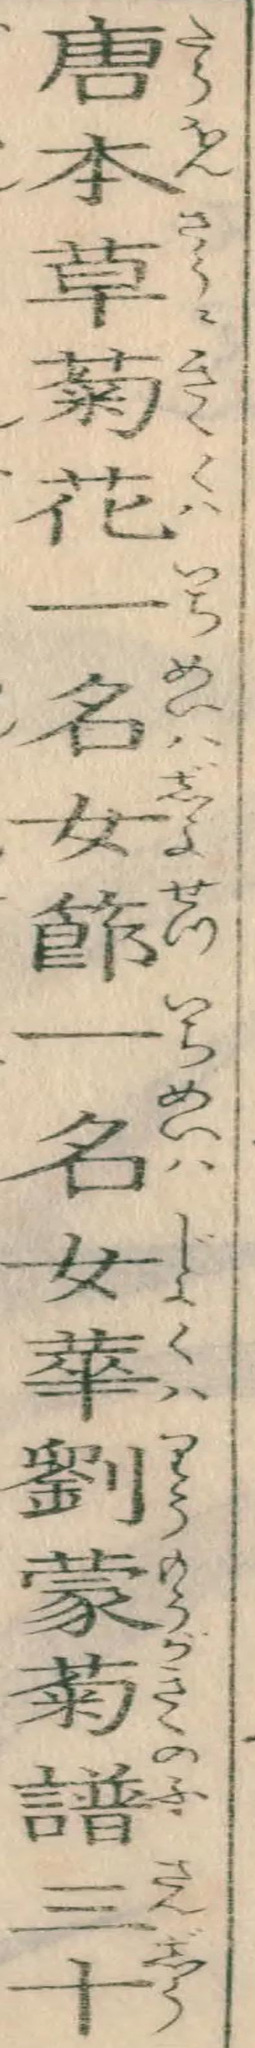唐本草菊花一名女節一名女華劉蒙菊譜三十
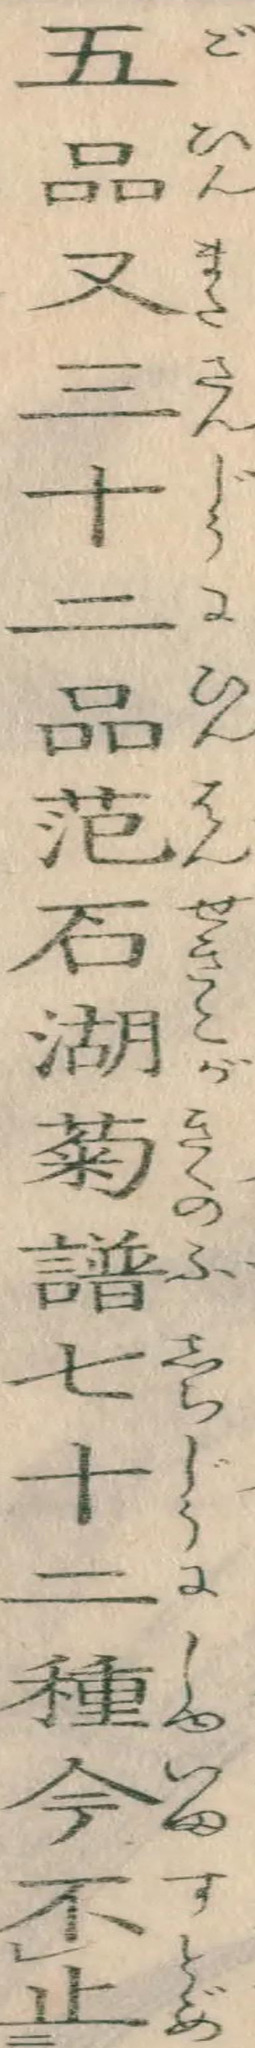五品又三十二品范石湖菊譜七十二種今不止
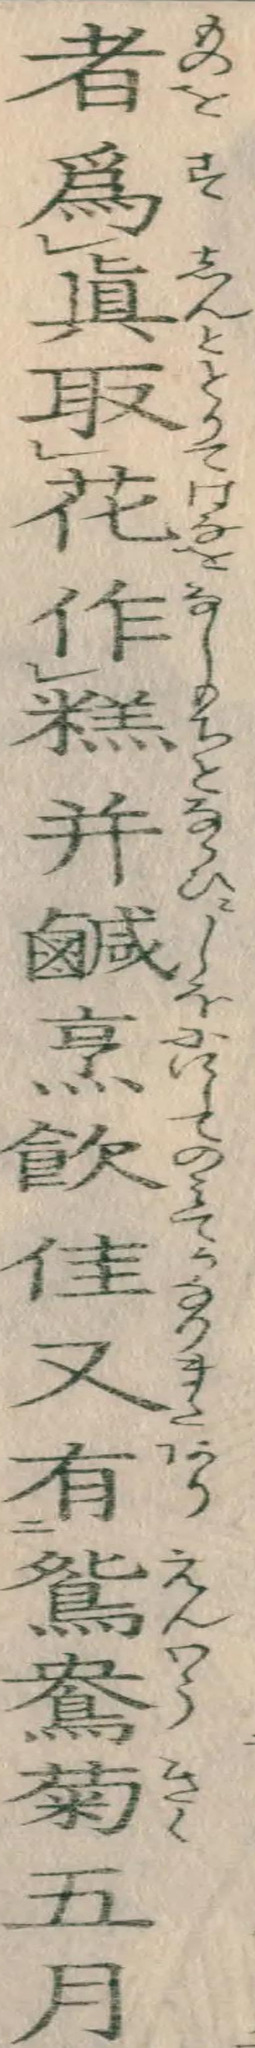者為真取花作糕并鹹烹飲佳又有鴛鴦菊五月
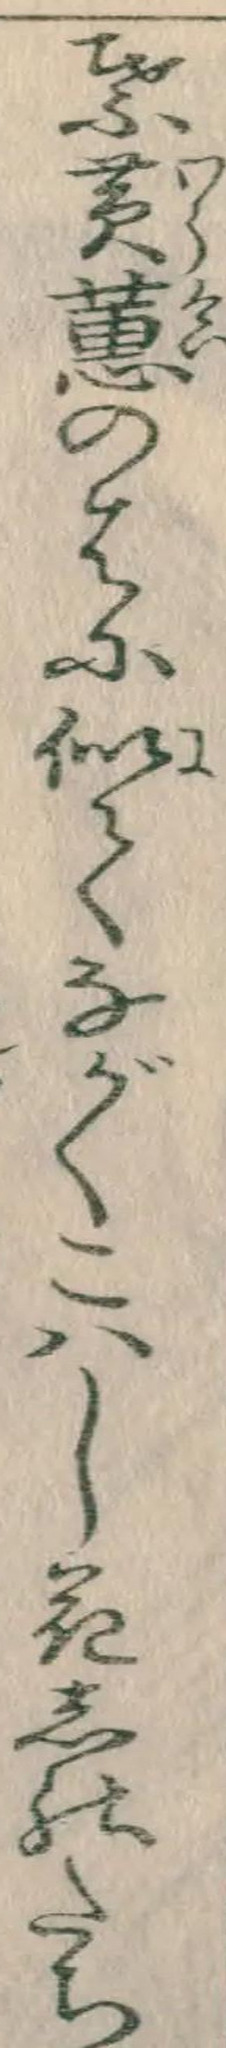葉黄蕙のはに似てながくこはし花しのたち
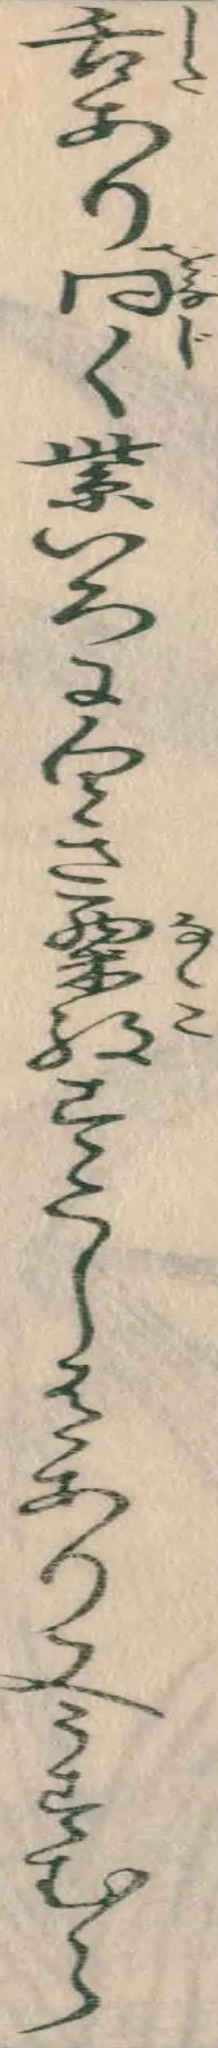舌あり同く紫いろに白き粟紋すこし有あり又うすむら
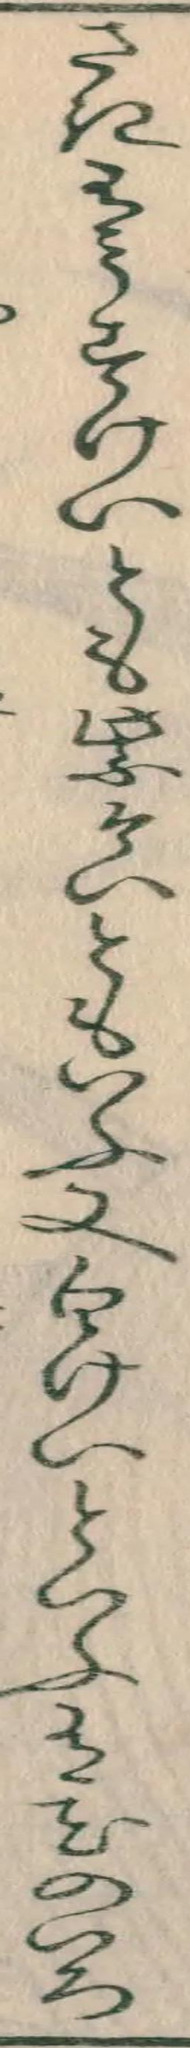さき有うすけいとも紫けいともいふ又白けいといふ有花のいろ
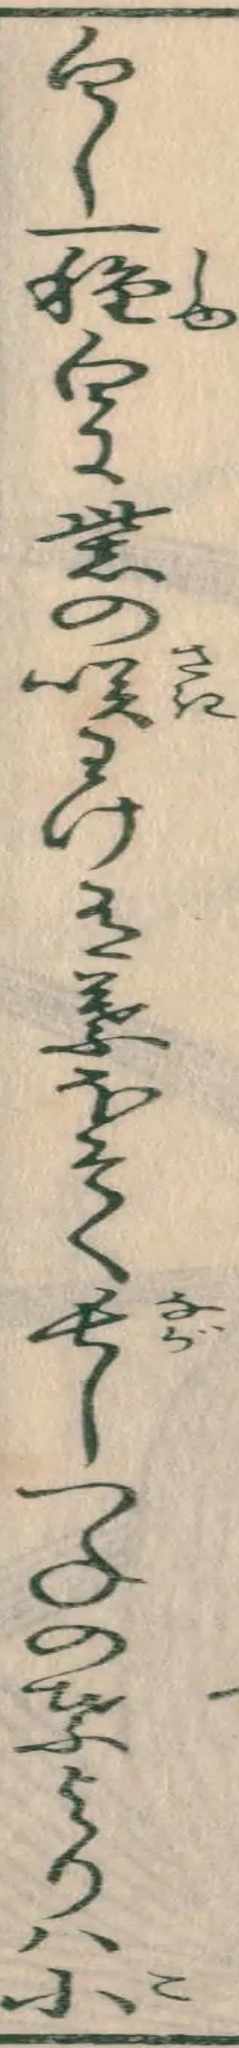白し一種白に紫の咲わけ有葉ほそく長しつねの葉よりは小
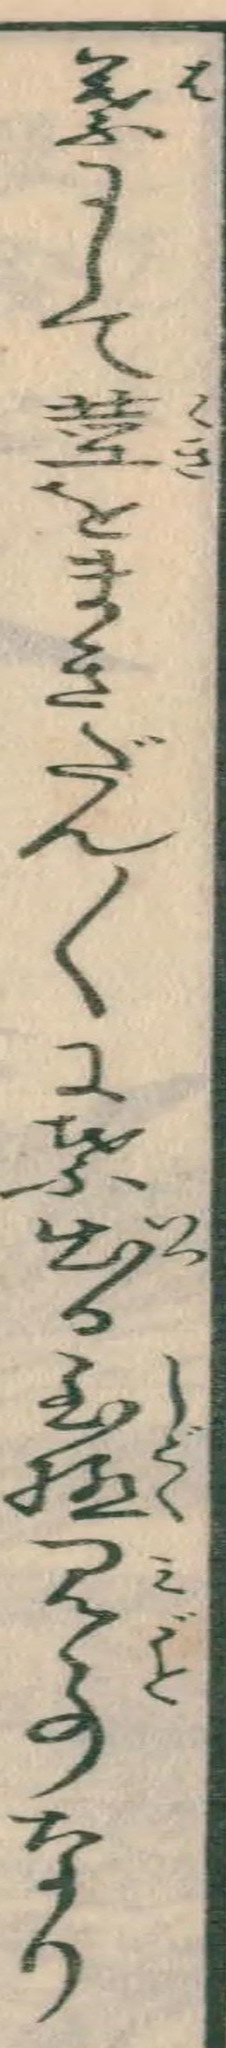葉にして茎をまきだん〳〵に葉出る至極見事なり
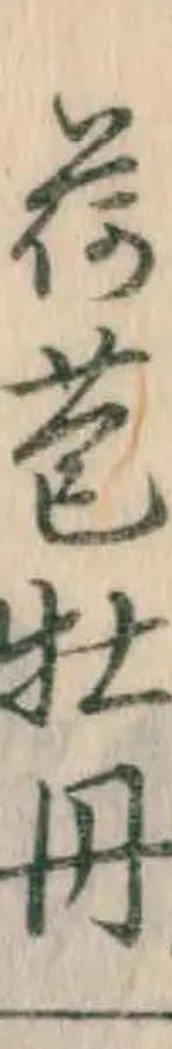荷苞牡丹
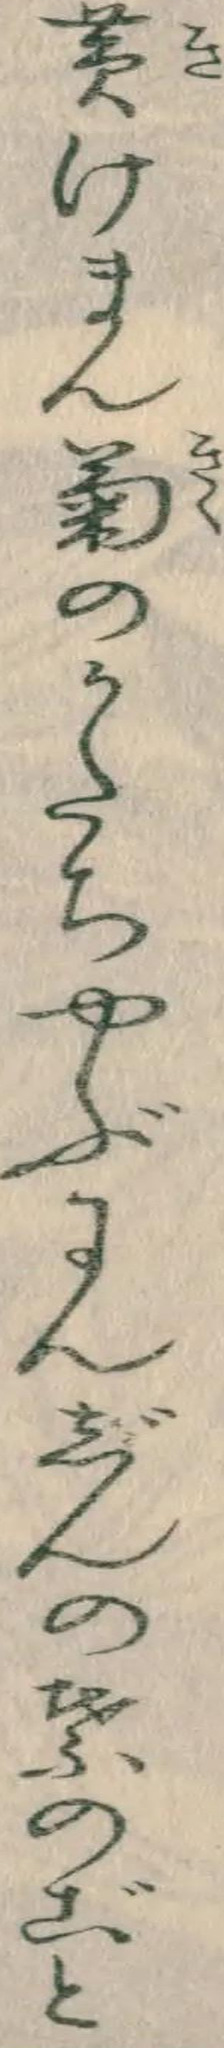黄けまん菊のかたちやぶにんじんの葉のごと
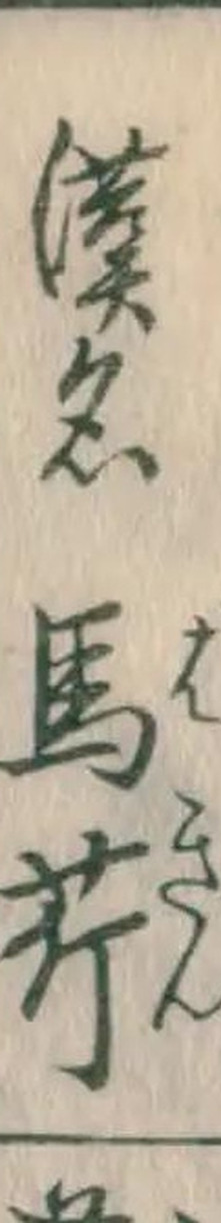漢名馬芹]
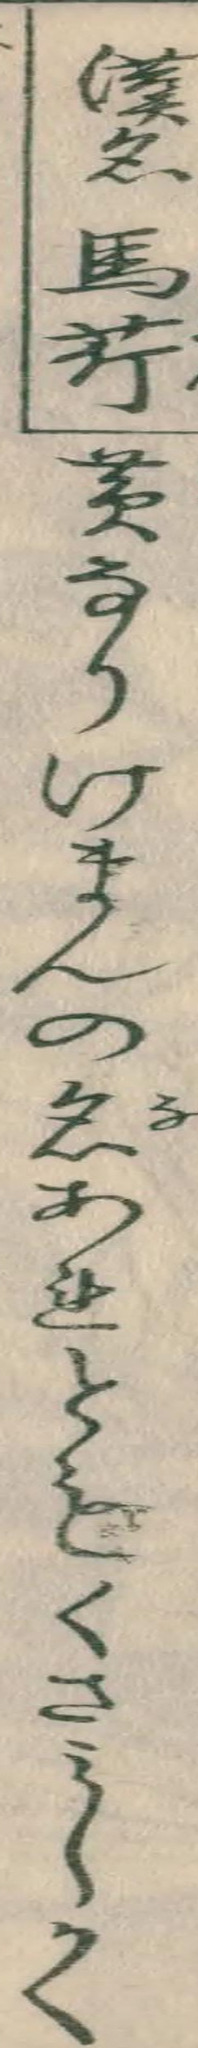黄なりけまんの名あれともくさみしかく
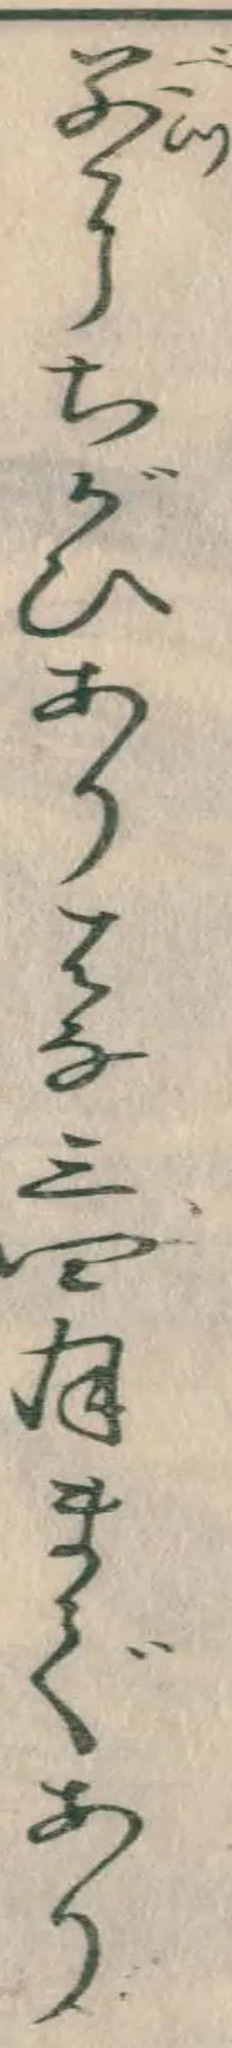別にちがひありはな三四月まであり
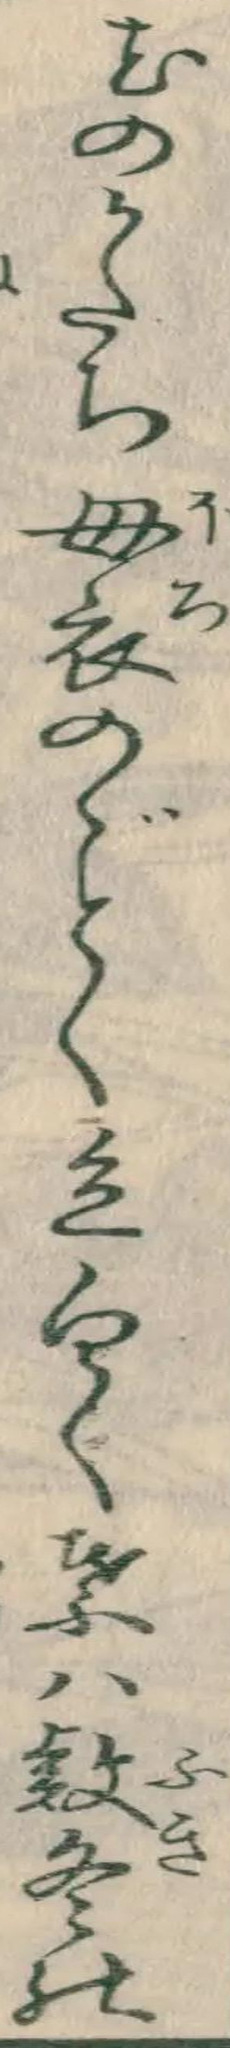花のかたち母衣のごとく色白く葉は款冬の
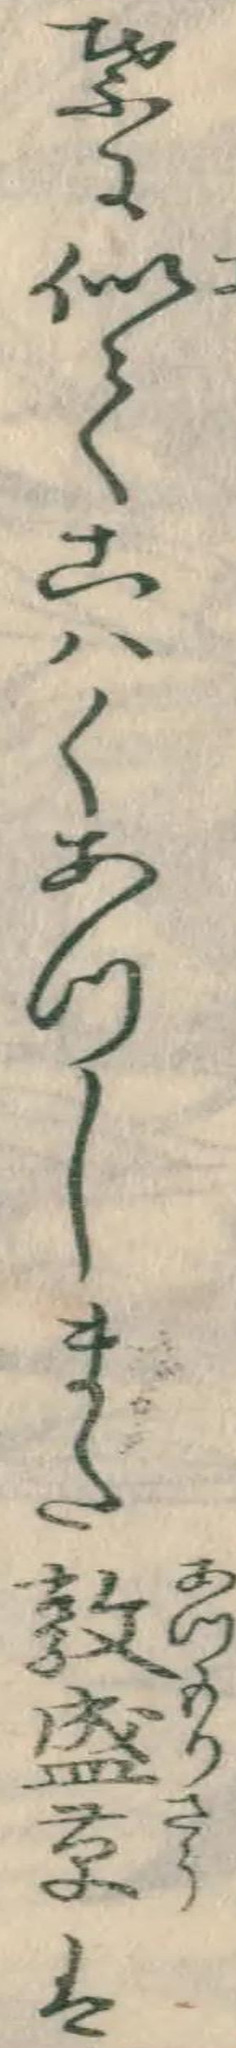葉に似てこはくあつしまた敦盛草は
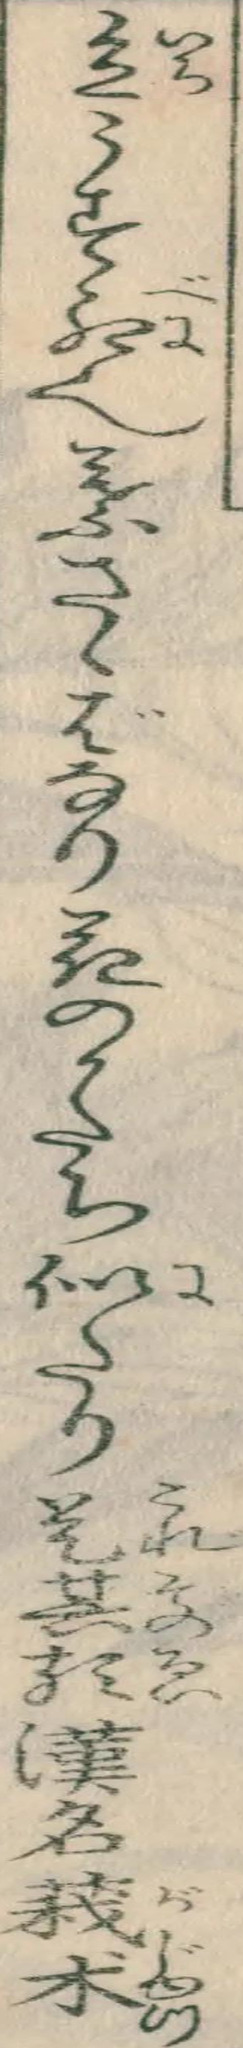色うす紅也葉さゝばなり花のかたち似たり是其類漢名莪朮
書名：畫本野山草. [1]
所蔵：国立国会図書館 National Diet Library, JAPAN
